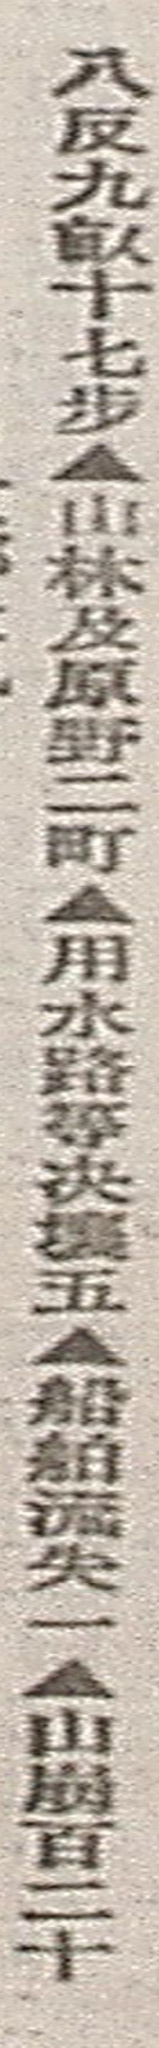八反九畝十七歩▲山林及原野二町▲用水路等决壊五▲船舶流失一▲山崩百二十
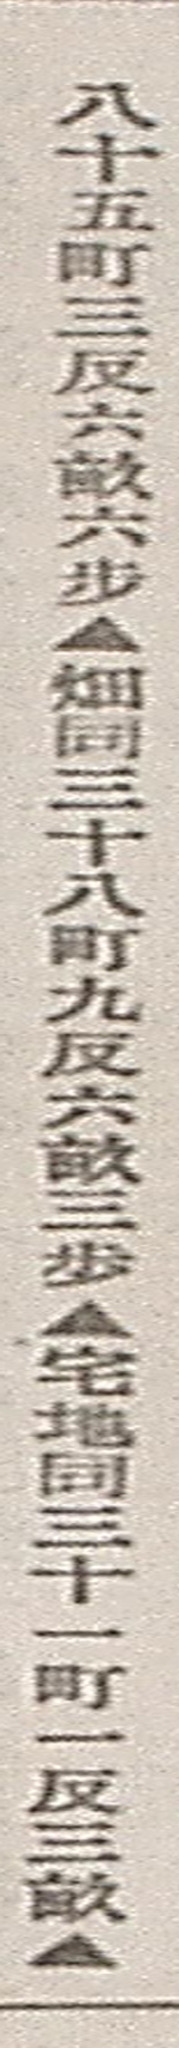八十五町歩三反六畝六歩▲畑同三十八町九反六畝三歩▲宅地同三十一町一反三畝▲
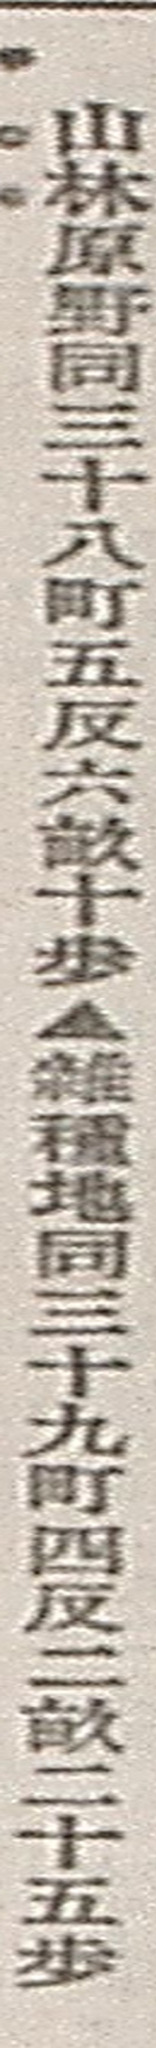山林原野々三十八町五反六畝十歩▲雑種地同三十九町四反二畝二十五歩
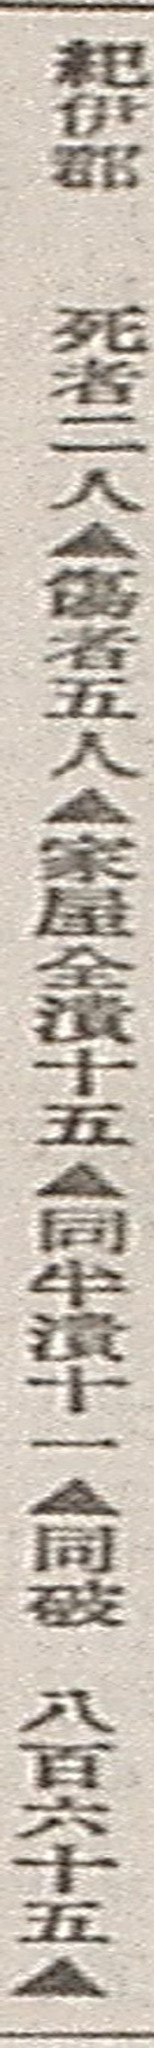紀伊郡死者二人▲傷者五人▲家屋全潰十五▲同半潰十一▲同破八百六十五▲
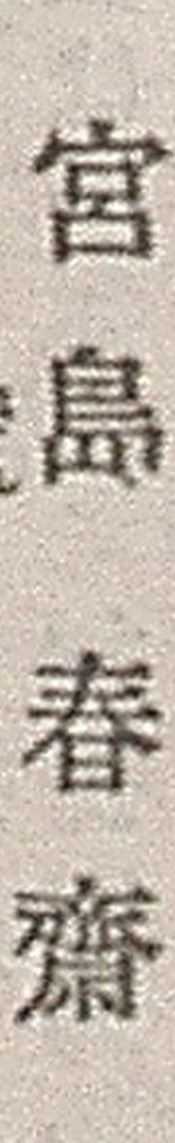宮島春齊
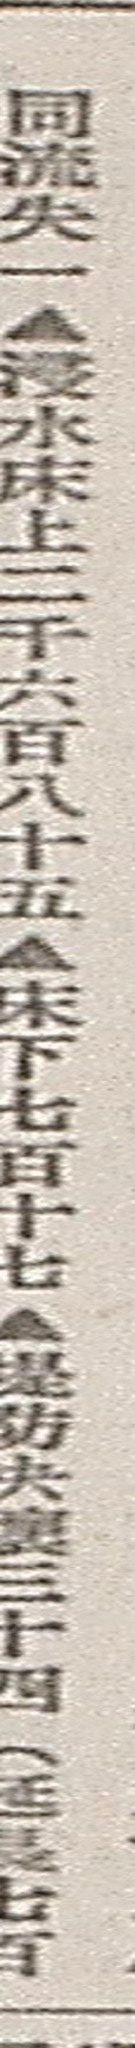同流失一▲浸水床上二千六百八十五▲床下七百十七▲堤防决壊三十四（延長七百
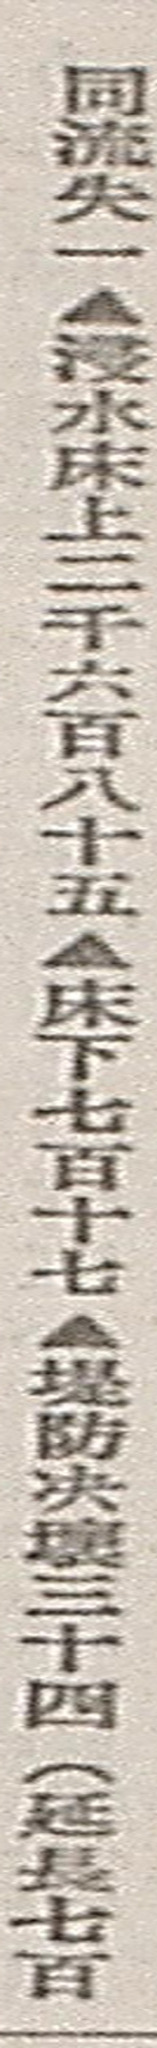同流失一▲浸水床上二千六百八十五▲床下七百十七▲堤防决壊三十四（延長七百
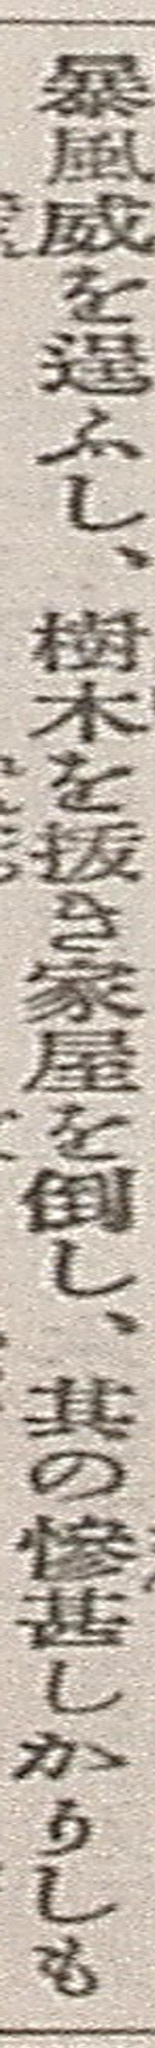暴風威を逞ふし、樹木を抜き家屋を倒し、其の惨甚しかりしも
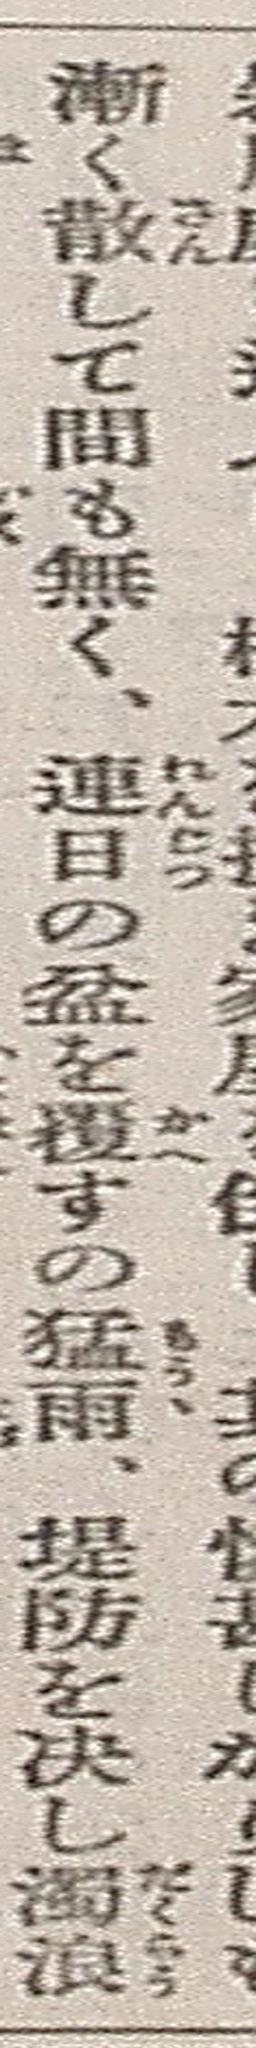漸く散して間も無く、連日の盆を覆すの猛雨、堤防を决し濁浪
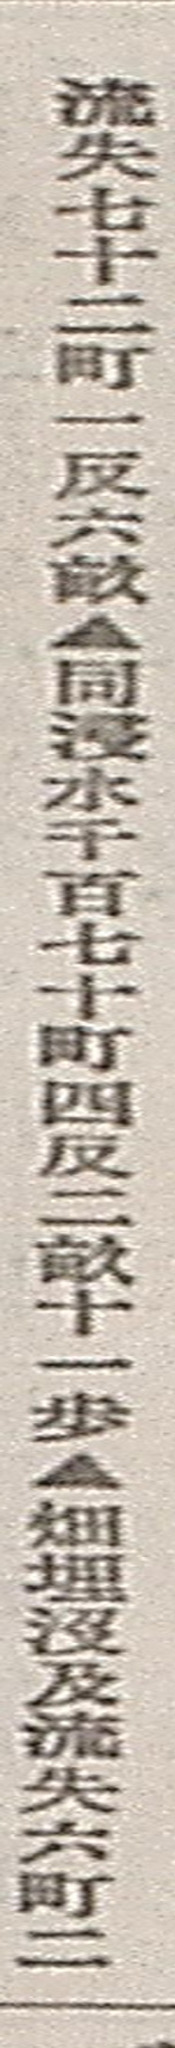流失七十二町一反六畝▲同浸水千百七十町四反二畝十一歩▲畑埋没及流失六町二
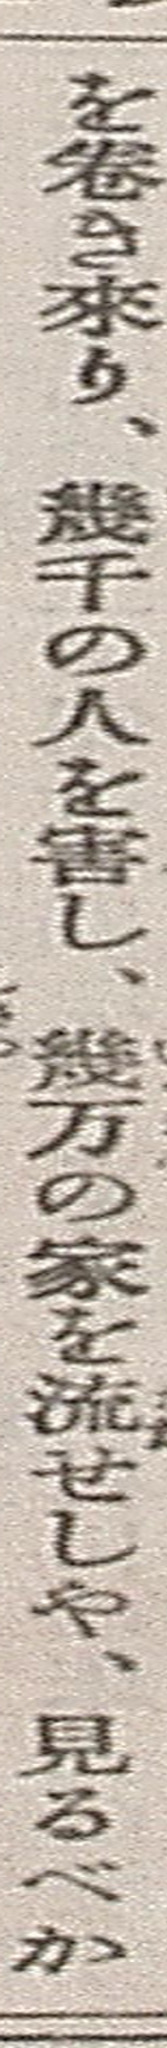ヲ巻き来り幾千の人を害し、幾万の家を流せしや、見るべか
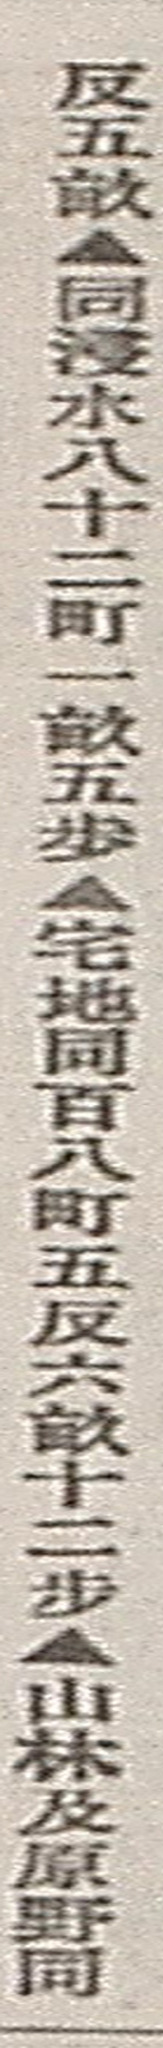反五畝▲同浸水八十二町一畝五歩▲宅地同百八丁五反六畝十二歩▲山林及原野同
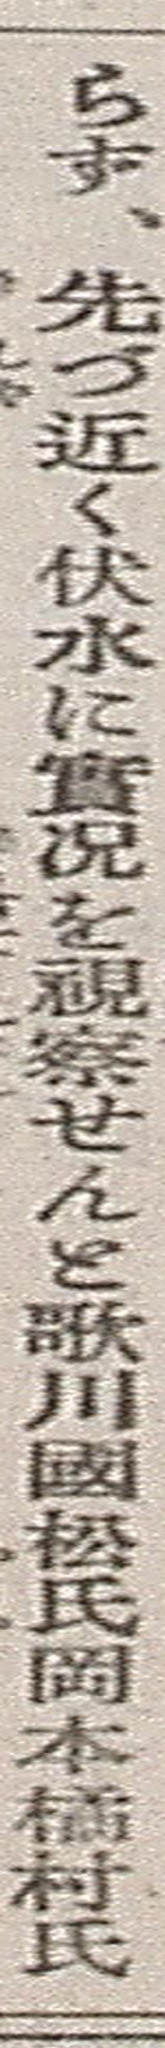らず、先づ近く伏水に実况を視察せんと歌川国松氏岡本橘村氏
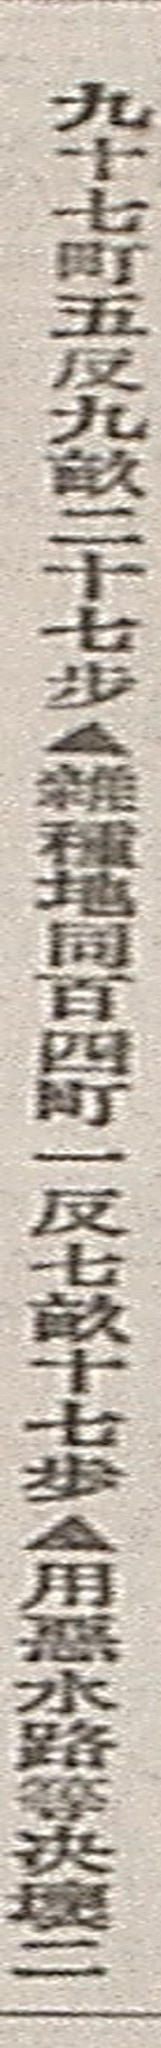九十七町五反九畝二十七歩▲雑種地同百四町一反七畝十七歩▲用悪水路等决壊二
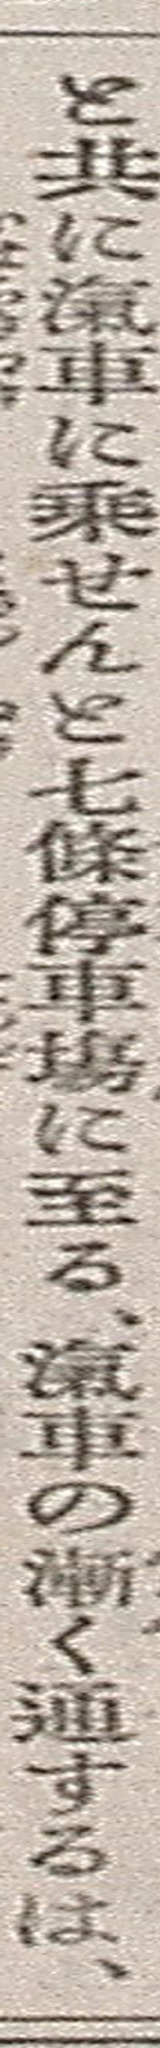と共に汽車に乗せんと七條停車場に至る、汽車の漸く通するは、
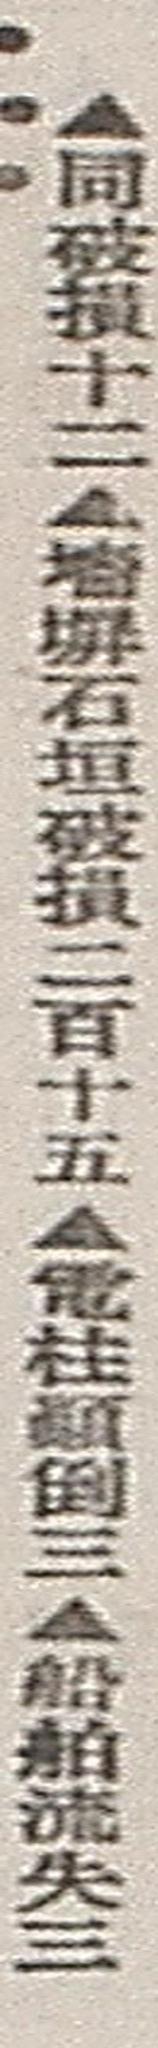▲同破損十二▲墻塀石垣破損二百十五▲電柱顚倒三▲船舶流失三
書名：風俗畫報臨時増刊第百二十八號　洪水被害録（下）
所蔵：東京大学地震研究所図書室 Earthquake Research Institute Library, The University of Tokyo, JAPAN
